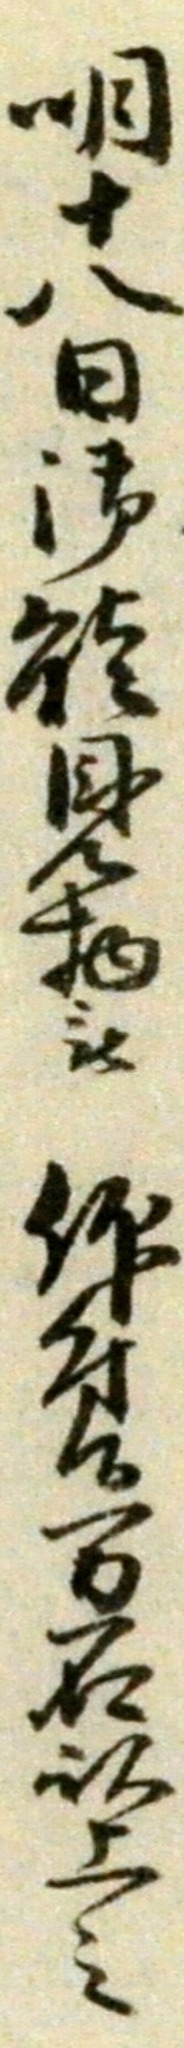明十八日御能見物被仰付候万石以上之
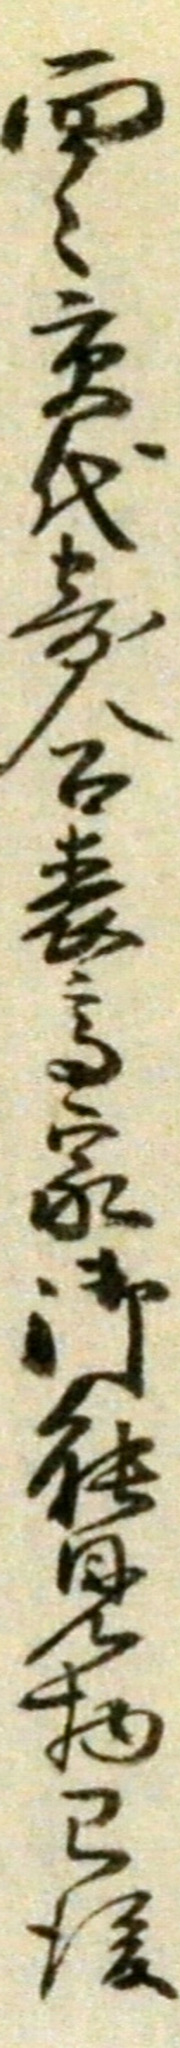面々交代寄合表高家御能見物已後
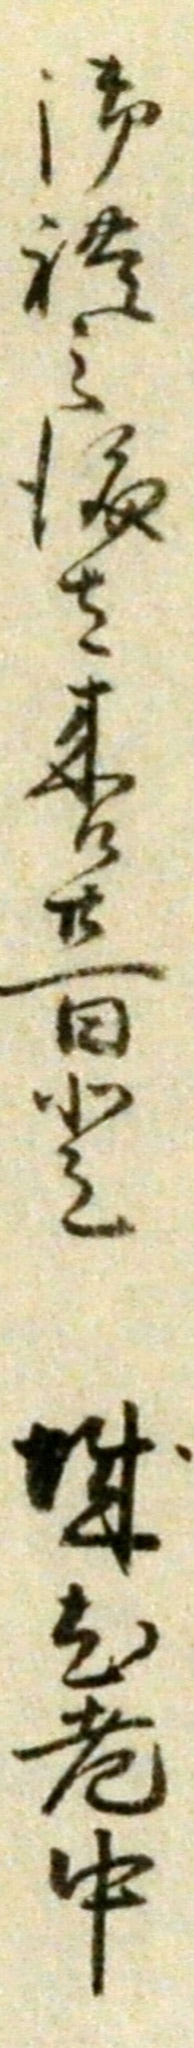御禮之儀は来ル廿一日登城尤老中
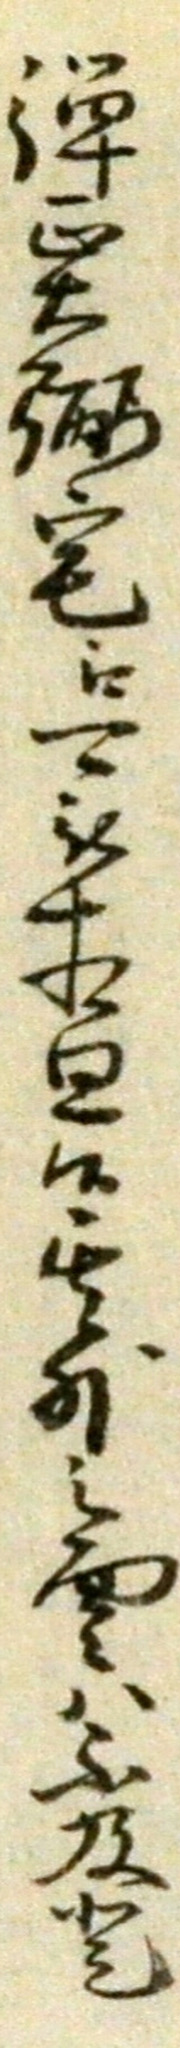弾正大弼宅え可被相廻候其外之面々ハ不及登
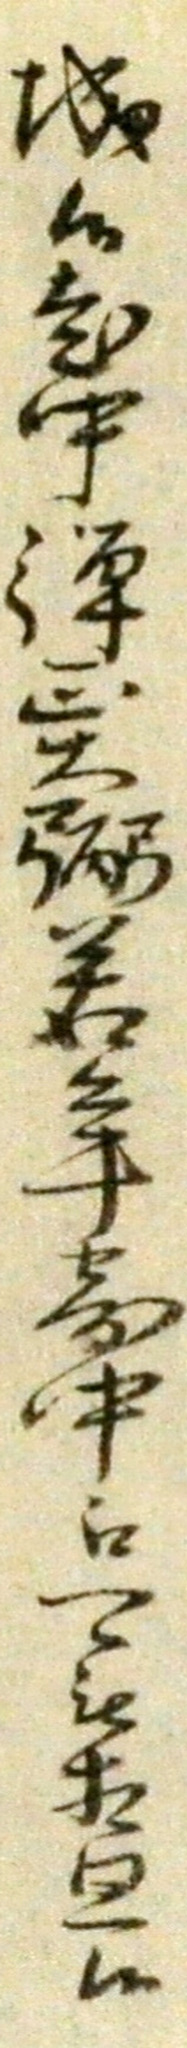城候老中弾正大弼若年寄中え可被相廻候
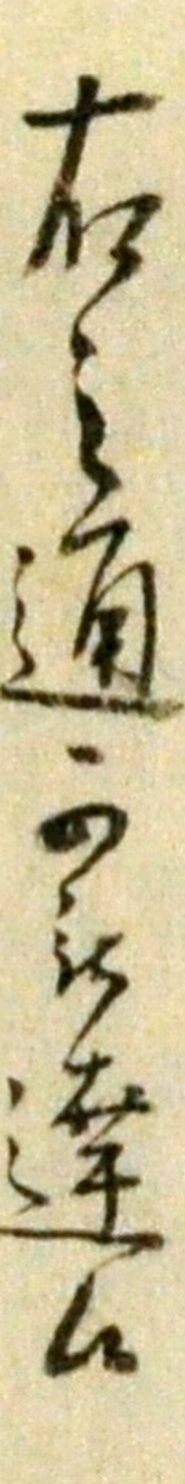右之通可被達候
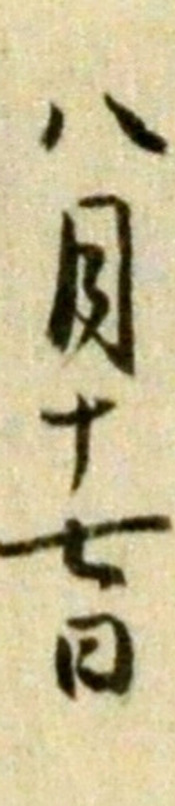八月十七日
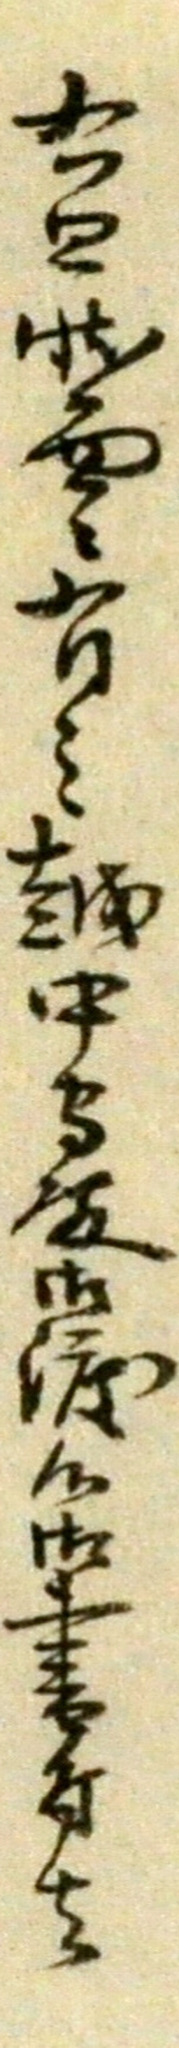右廻状面々有之越中守殿御渡候御書付は
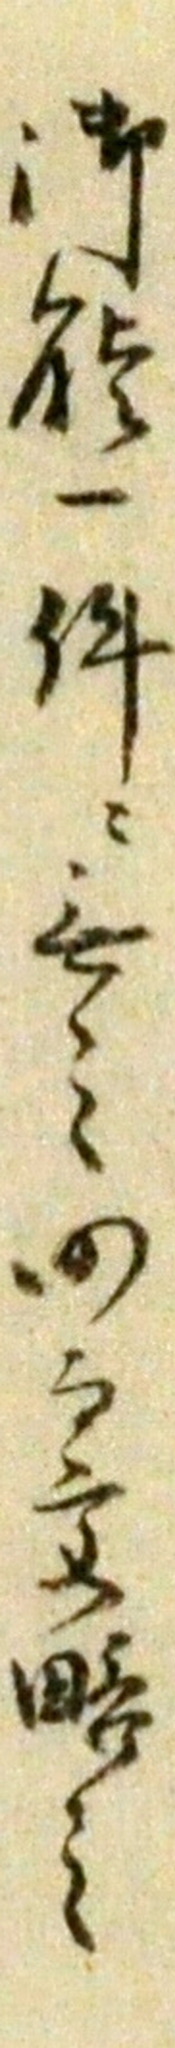御能一件ニ無之仍而文略之
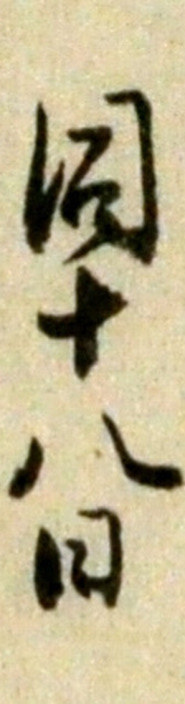同十八日
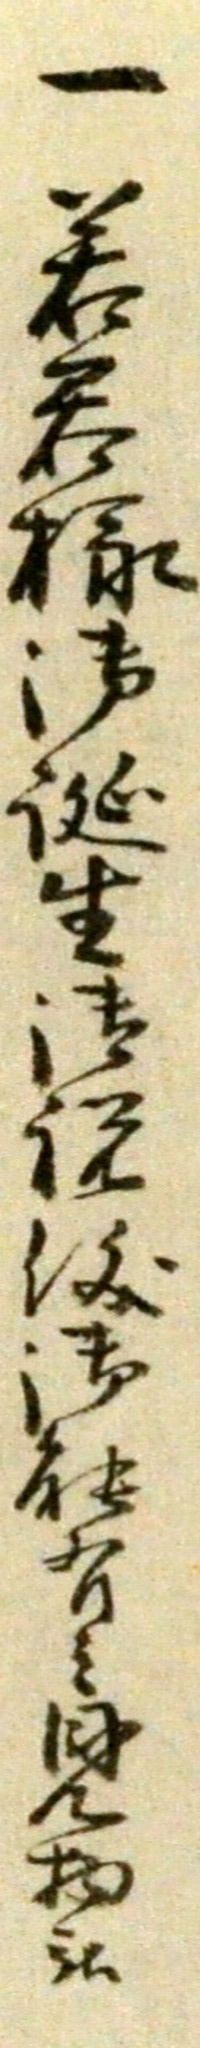一若君様御誕生御祝儀御能有之見物被
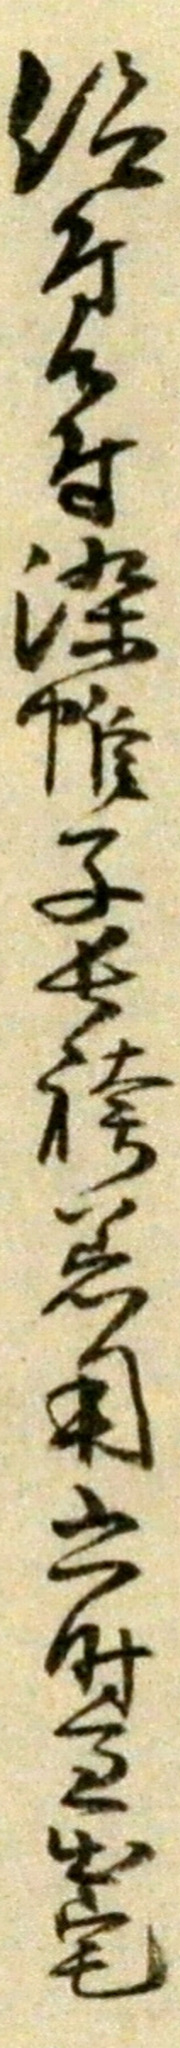仰付候付染帷子長袴着用六時過出宅
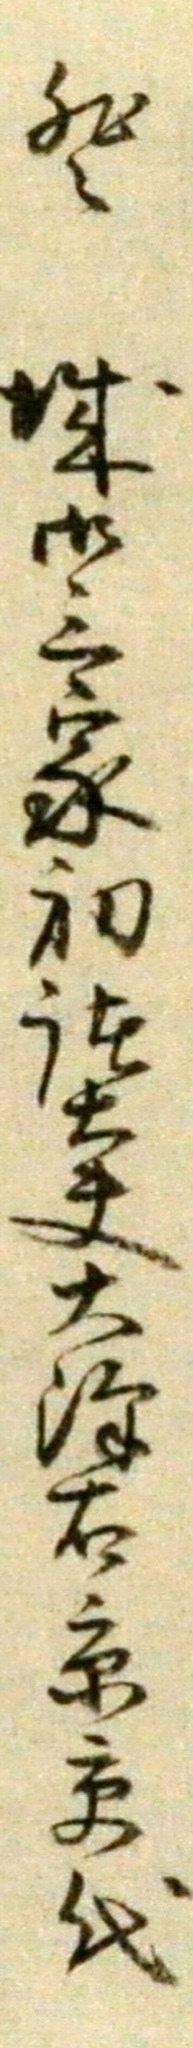登城御三家初諸大夫大沢右京交代
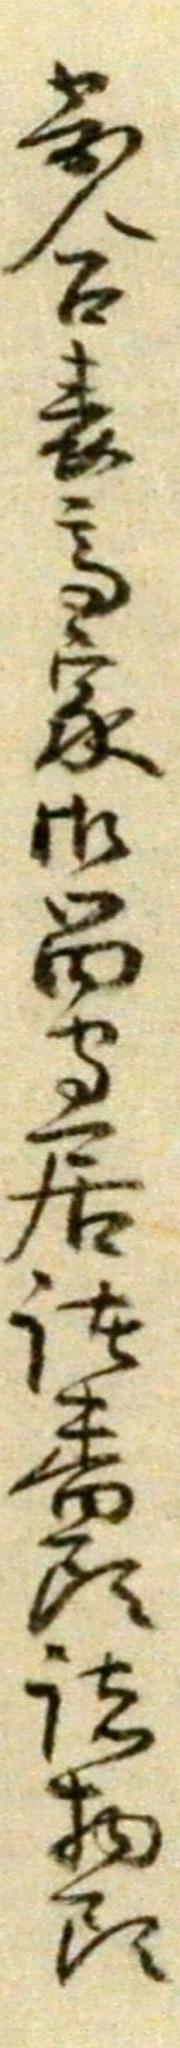寄合表高家御留守居諸番頭諸物頭
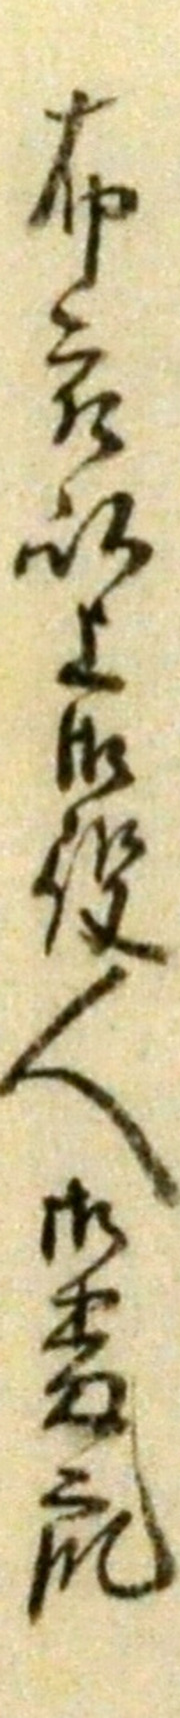布衣以上御役人御番衆
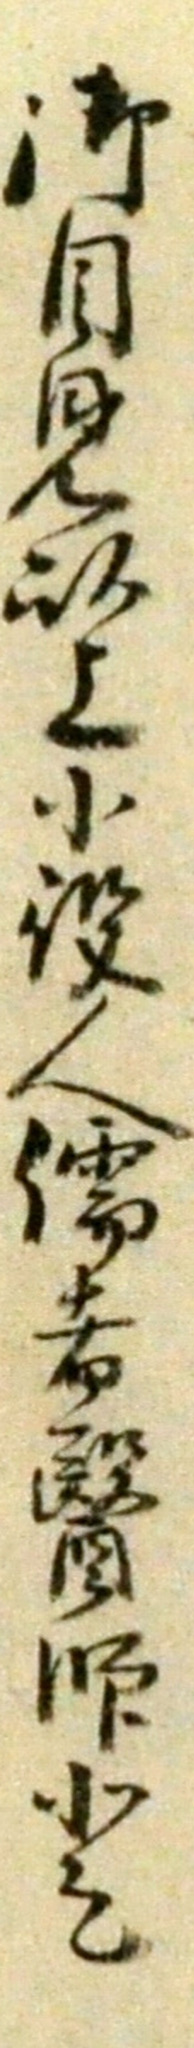御目見以上小役人儒者醫師登
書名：若君様（家斉嫡男）誕生諸祝儀ノ節ノ留書外
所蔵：伊那市立高遠町図書館・合同会社AMANE
